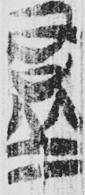羣（群）
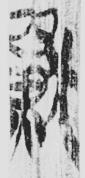○（獸）
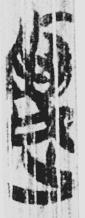○（遱）
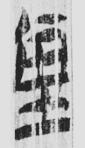朋
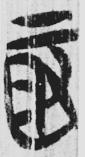取
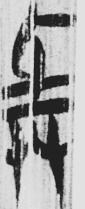與（與）
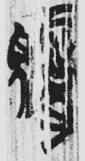○（誢）
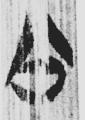公
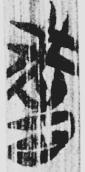○（嚳）
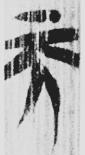而
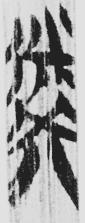○（播）
